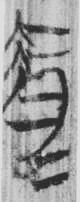肉
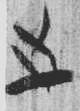之
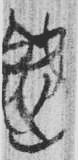既
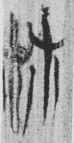○（靡）
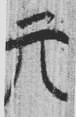亓（其）
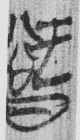智
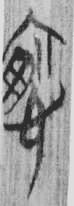愈
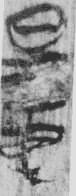暲（彰）
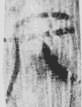亓（其）
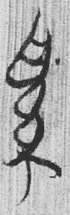○（奚）
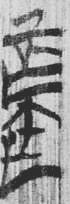○（適）
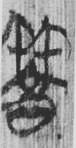○（孰）
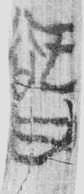智（知）
